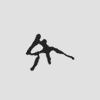余
